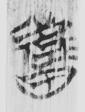{萑田}
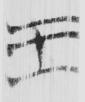王
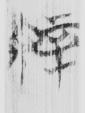親
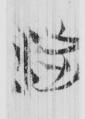涉
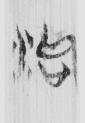泃
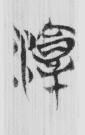淳
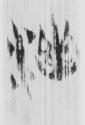{水幽}
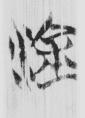塗
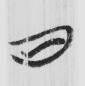日
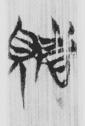{見青}
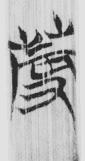蓐
